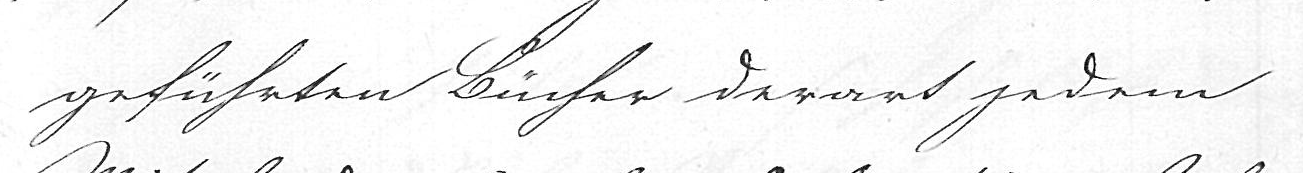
geführten Bücher derart jedem
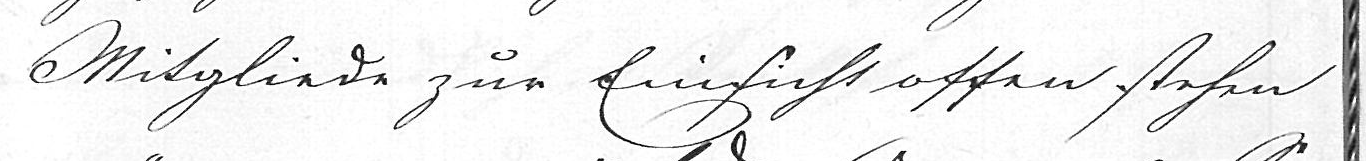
Mitgliede zur Einsicht offen stehen
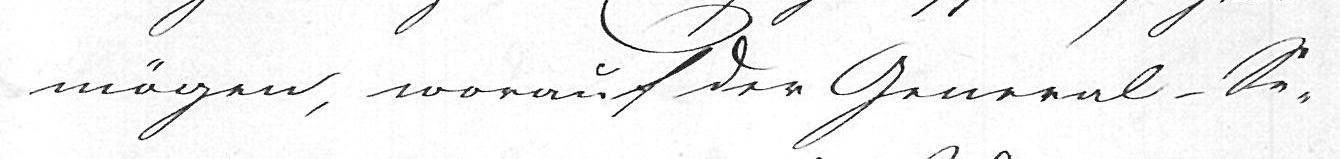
mögen, worauf der General-Se-
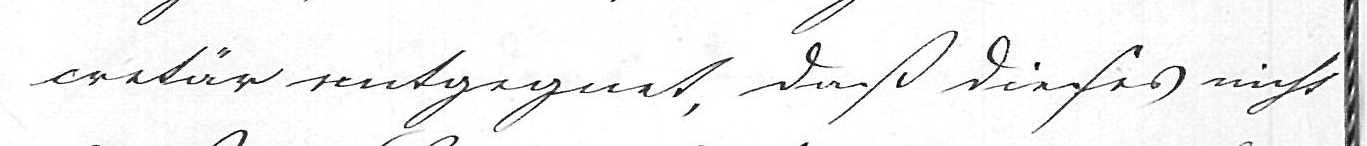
cretär entgegnet, daß dieses nicht
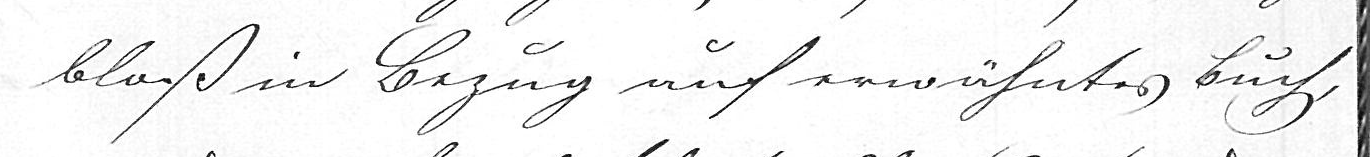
bloß in Bezug auf erwähntes Buch,
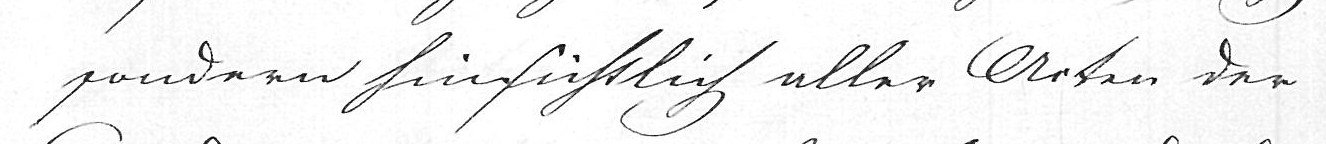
sondern hinsichtlich aller Acten der
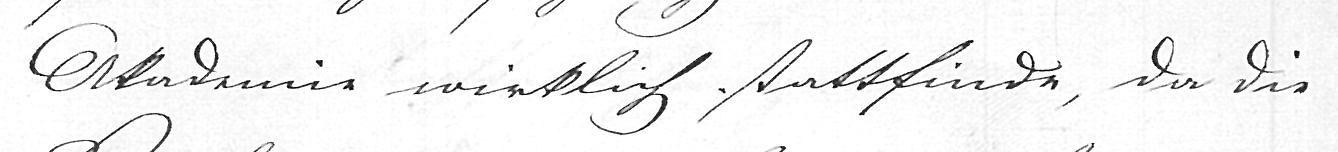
Akademie wirklich stattfinde, da die
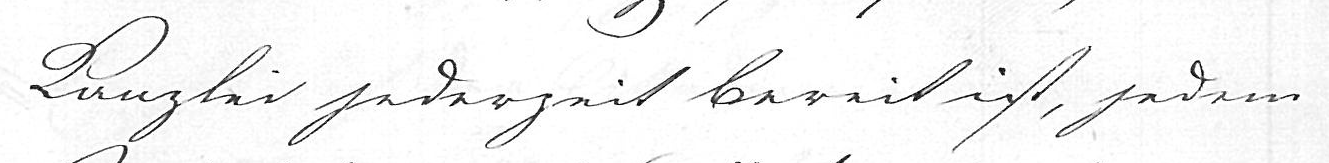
Kanzlei jederzeit bereit ist, jedem
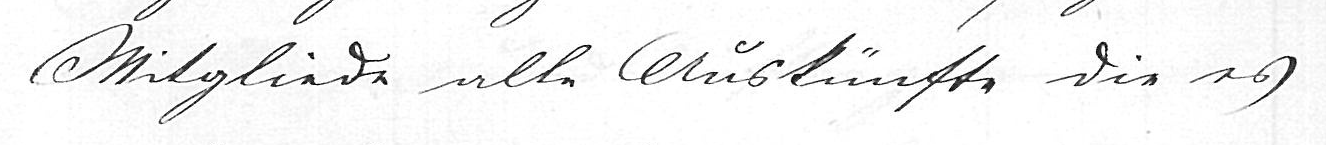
Mitgliede alle Auskünfte, die es
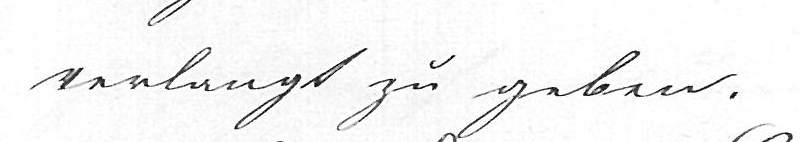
verlangt zu geben.
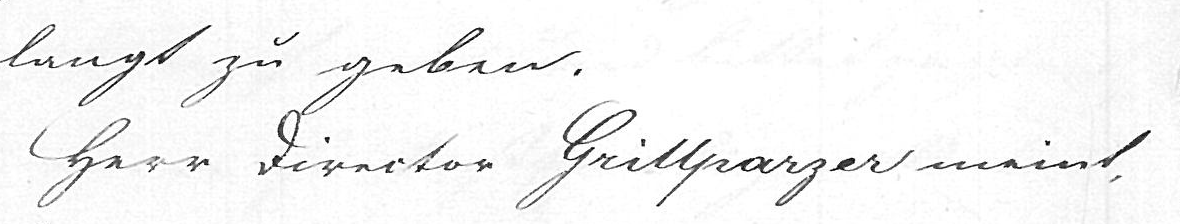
Herr Director Grillparzer meint,
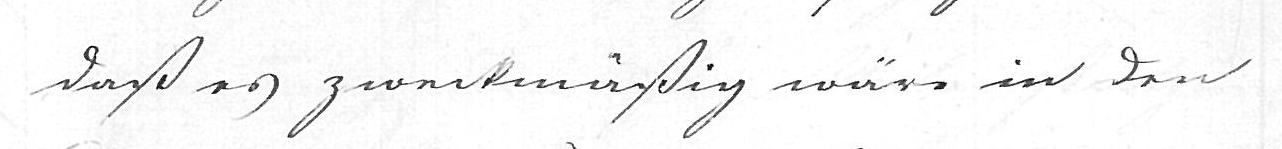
daß es zweckmäßig wäre in den
